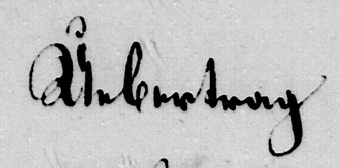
Uebertrag
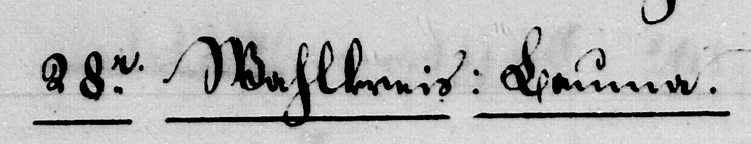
28.r. Wahlkreis: Bauma.
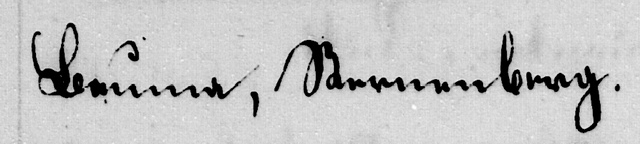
Bauma, Sternenberg
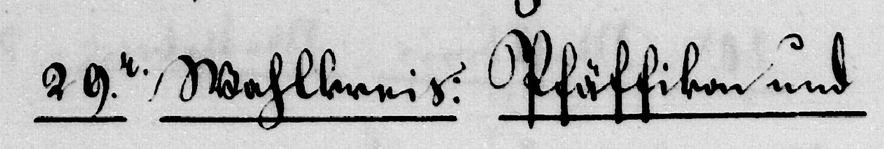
29.r. Wahlkreis: Pfäffikon und
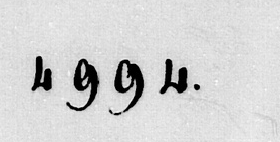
4994.
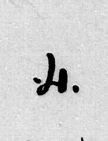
4.
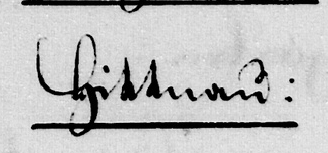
Hittnau:
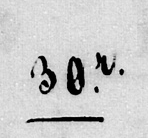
30.r.
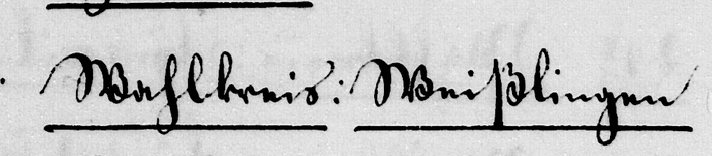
Wahlkreis: Weißlingen
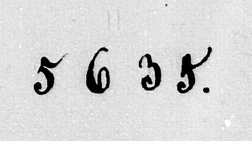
5635.
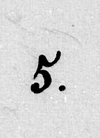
5.
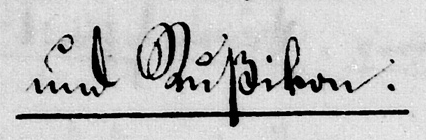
und Rußikon:
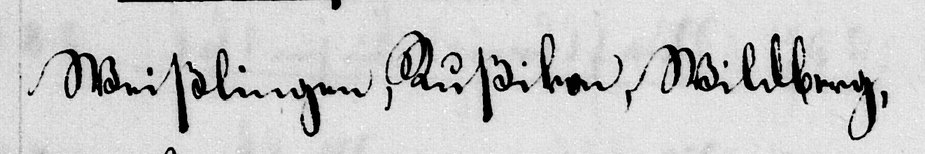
Weißlingen, Rußikon, Wihlberg,
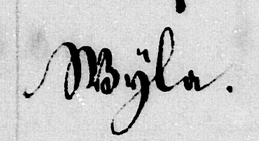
Wyla.
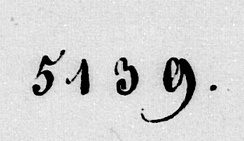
5139.
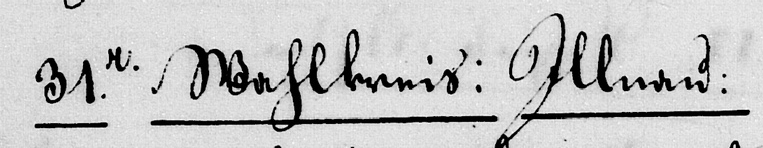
31.r. Wahlkreis: Illnau:
